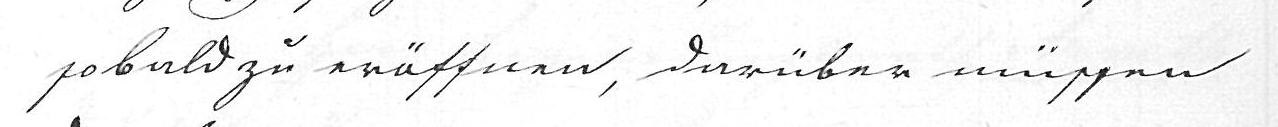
sobald zu eröffnen, darüber müssen
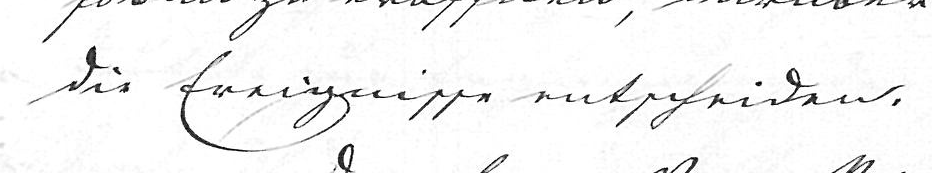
die Ereignisse entscheiden.
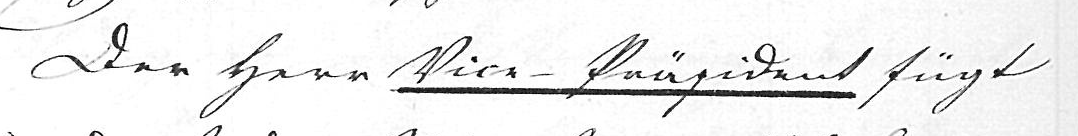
Der Herr Vice-Präsident fügt
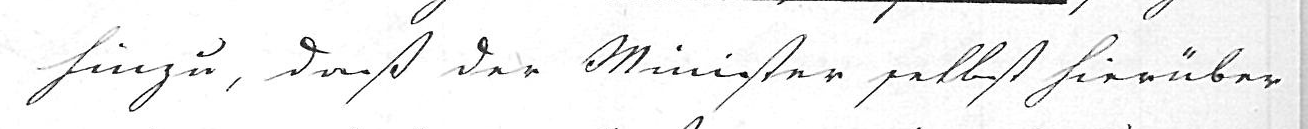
hinzu, daß der Minister selbst hierüber
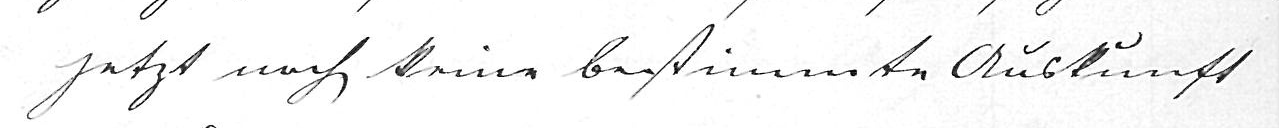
jetzt noch keine bestimmte Auskunft
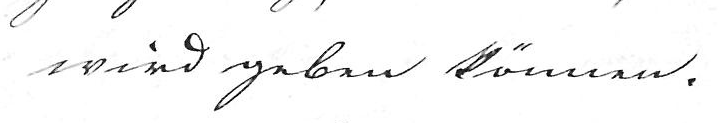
wird geben können.
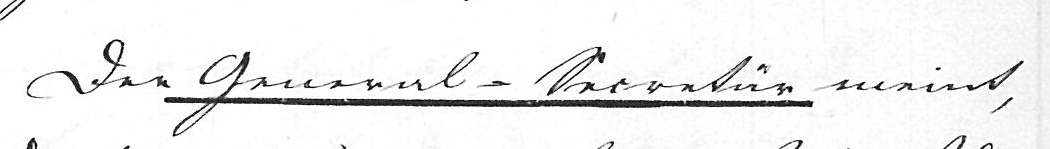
Der General-Secretär meint,
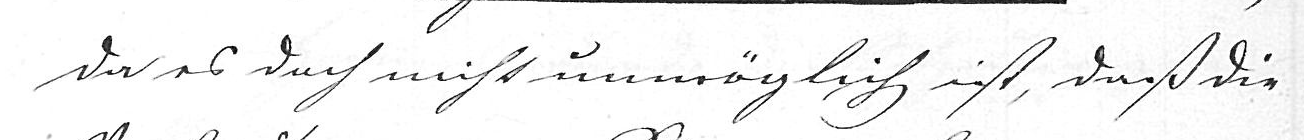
da es doch nicht unmöglich ist, daß die
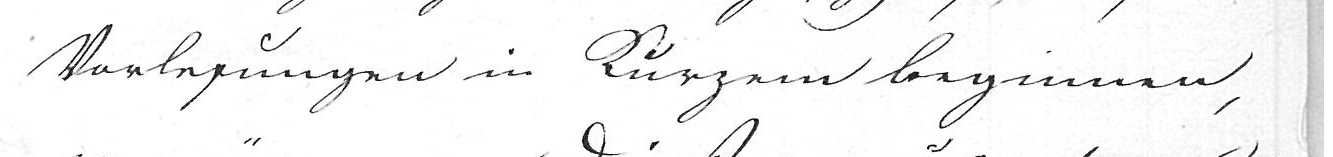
Vorlesungen in Kurzem beginnen,
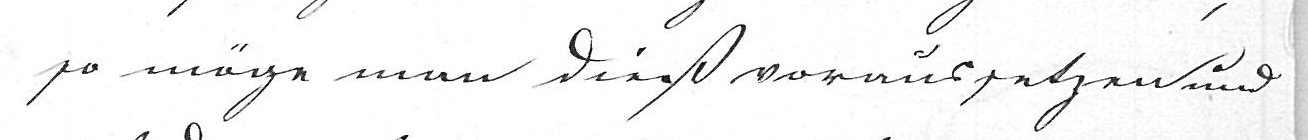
so möge man dieß voraussetzen und
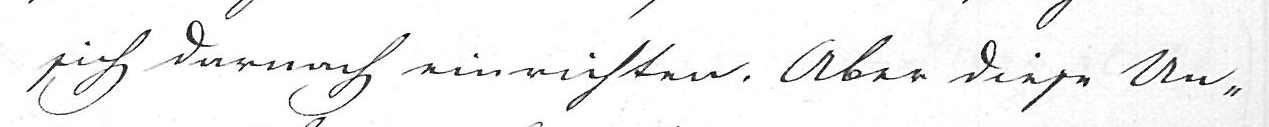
sich darnach einrichten. Aber diese Un-
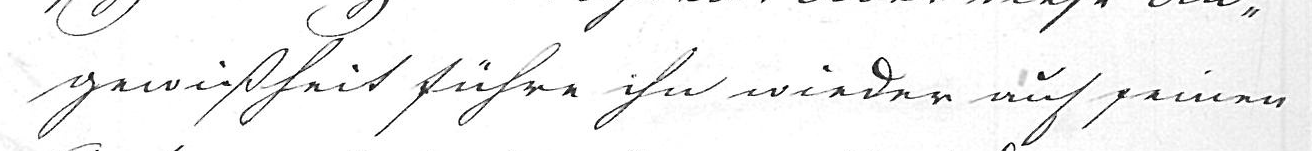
gewißheit führe ihn wieder auf seinen
